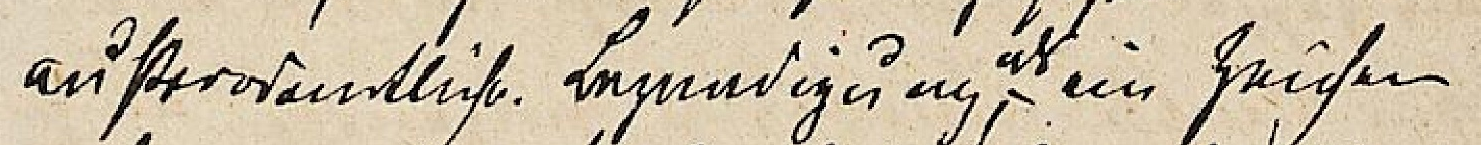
außerordentliche Begnadigung, als ein Zeichen
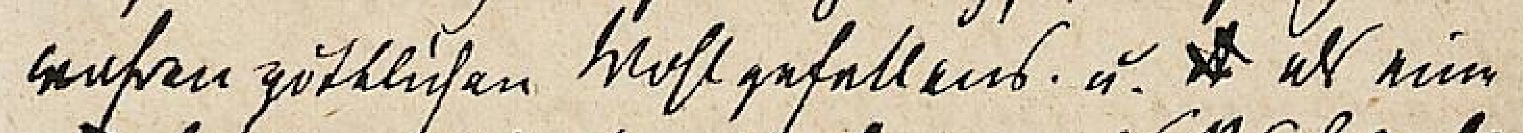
wahren göttlichen Wohlgefallens. u. als eine
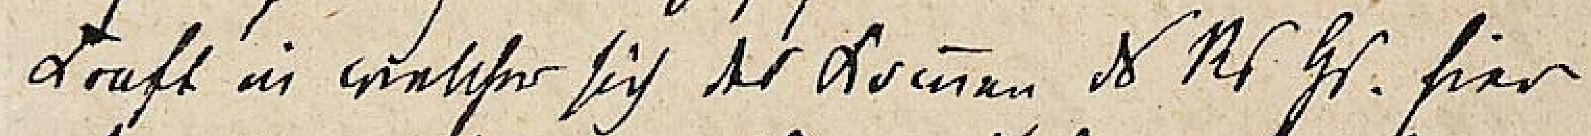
Kraft in welcher sich des Komen ds Rs. Gottes hier
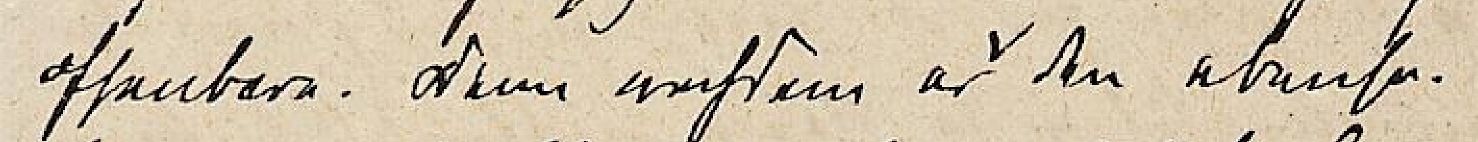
offenbare. Denn nachdem er den ebenso
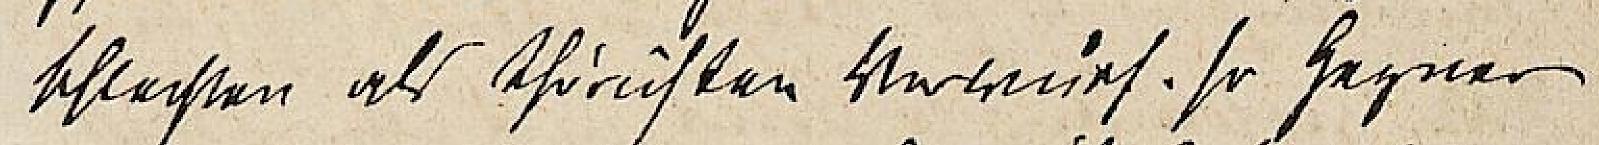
schlechten als thörichten Vorwurf sr Gegner
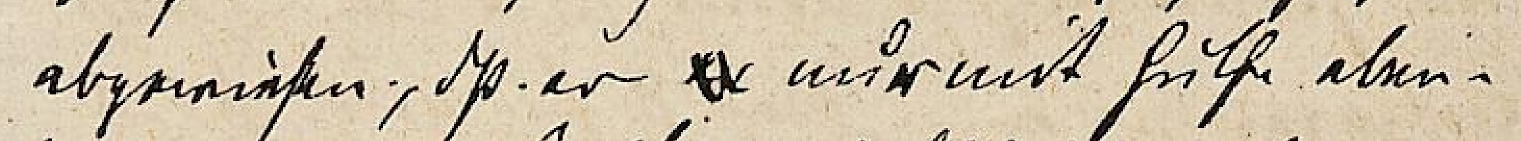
abgewiesen, dß er nur mit Hilfe eben¬
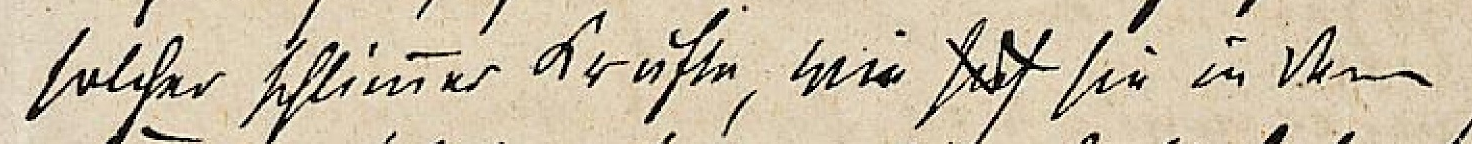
solcher schlimer Kräft, wie sich sie in dem
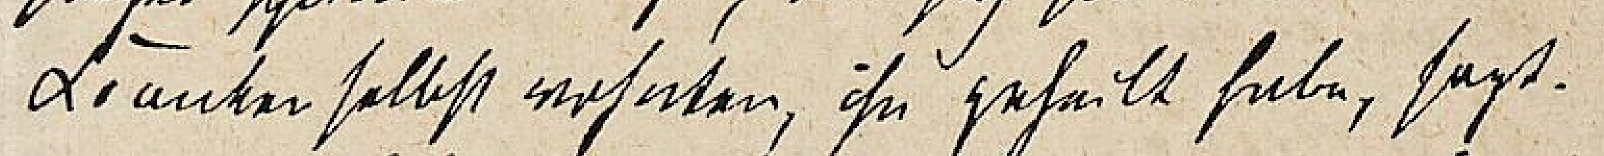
Kranken selbst wohnten, ihn geheilt habe, sagt.
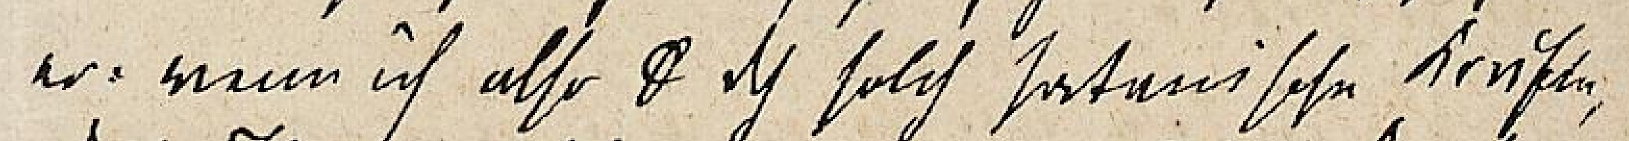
er: wenn ich also o dch solch satanischen Kräfte,
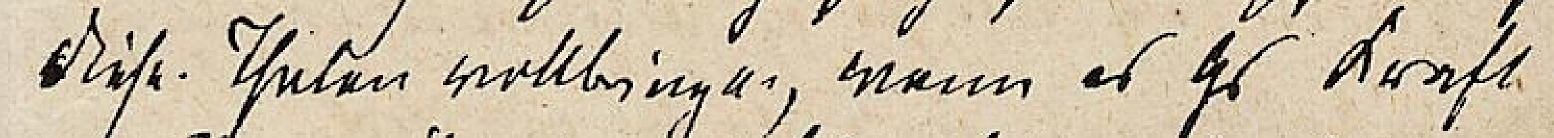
diese Thaten vollbringe, wenn es Gs Kraft
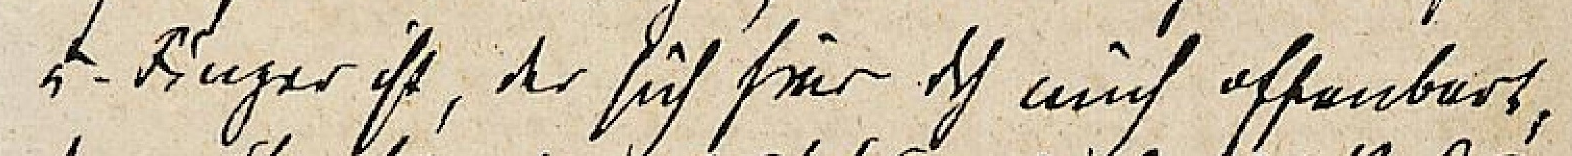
u. Finder ist, der sich hier dch mich offenbart,
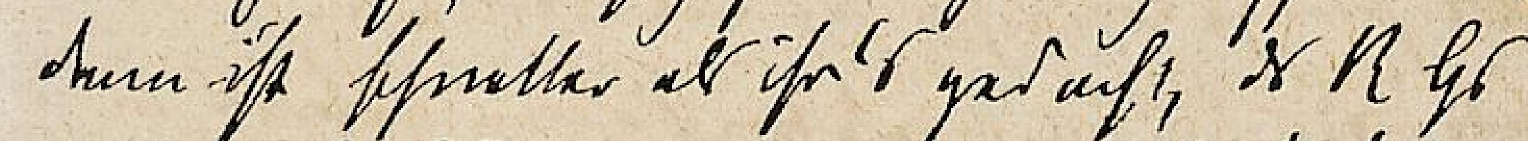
dann ist schneller als ihr's gedacht, ds R Gs
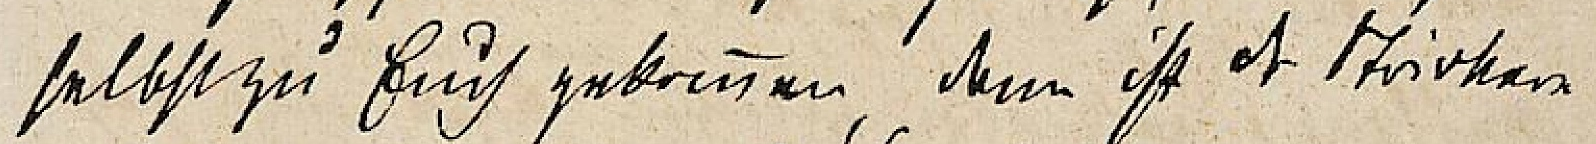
selbst zu Euch gekomen, dann ist dr Stärkere
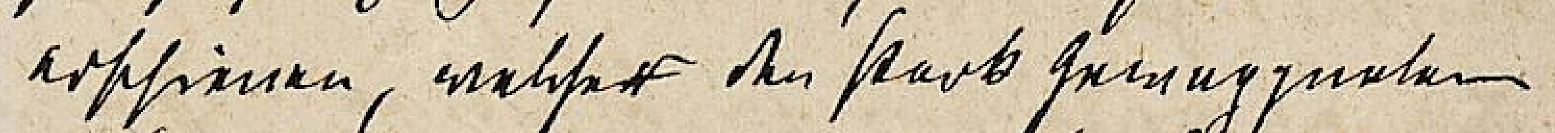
erschienen, welcher den stark Gewappneten
